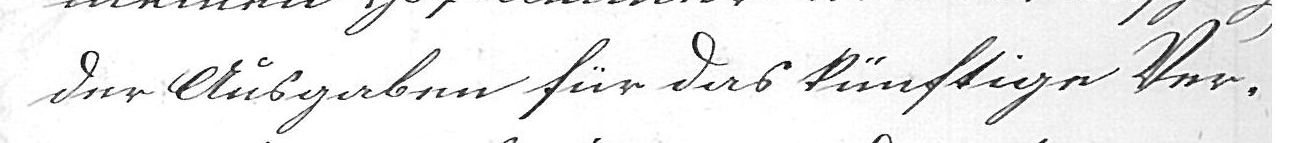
der Ausgaben für das künftige Ver-
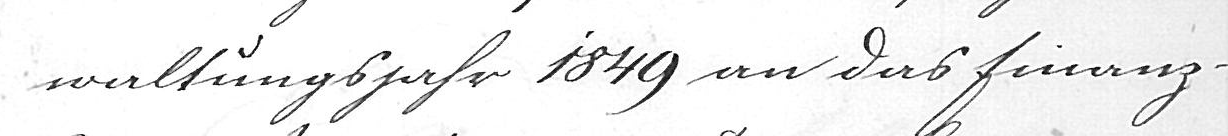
waltungsjahr 1849 an das Finanz-
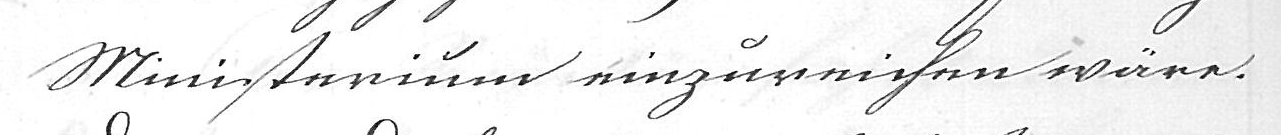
Ministerium einzureichen wäre.
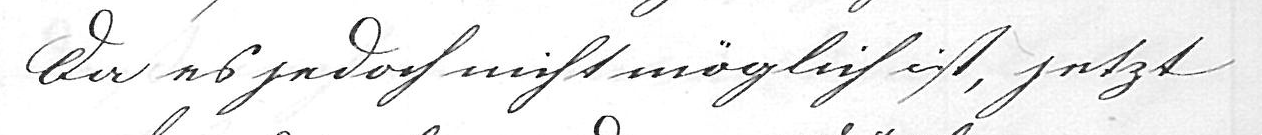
Da es jedoch nicht möglich ist, jetzt
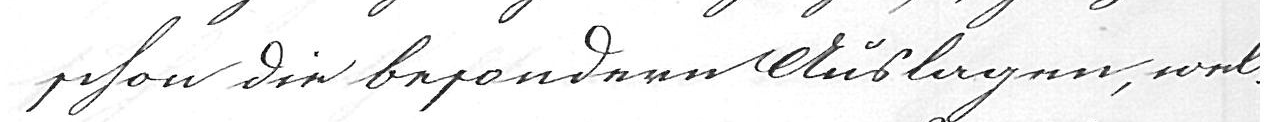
schon die besondern Auslagen, wel-
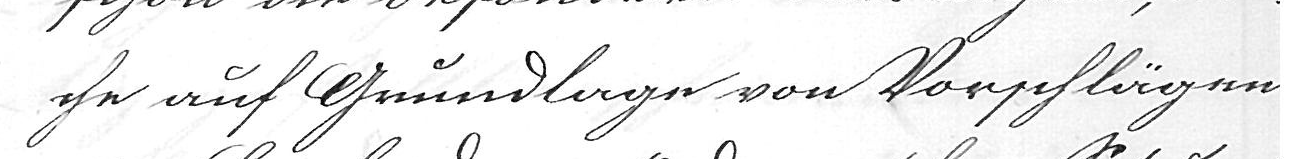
che auf Grundlage von Vorschlägen
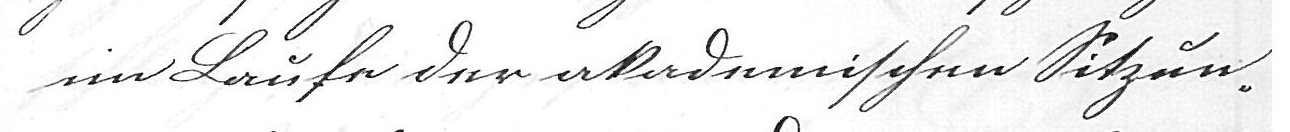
im Laufe der akademischen Sitzun-
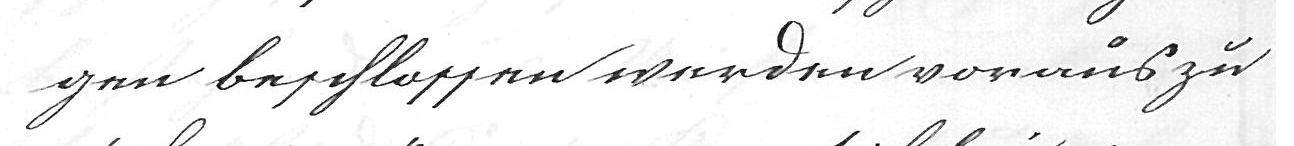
gen beschlossen werden voraus zu
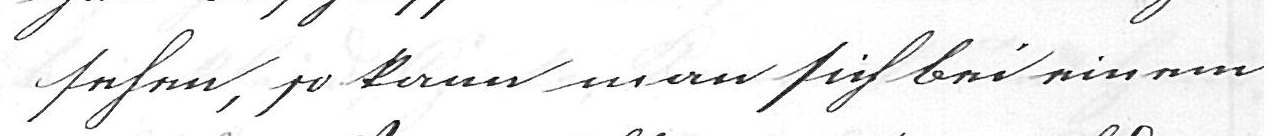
sehen, so kann man sich bei einem
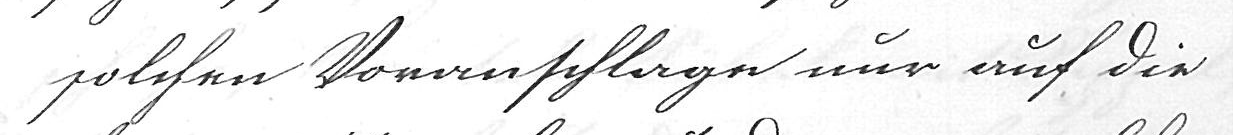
solchen Voranschlage nur auf die
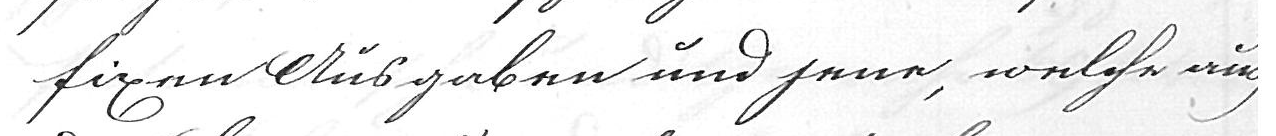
fixen Ausgaben und jene, welche aus
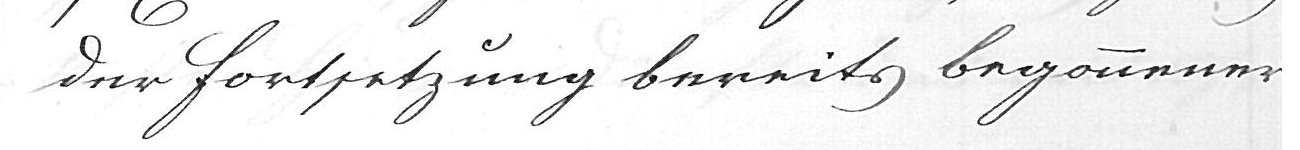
der Fortsetzung bereits begonnener
